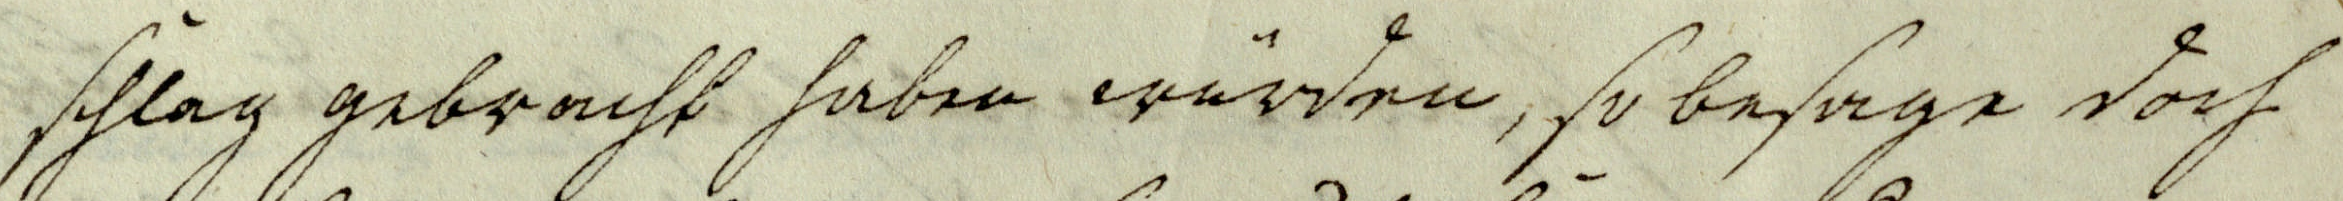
schlag gebracht haben würden, so besage doch
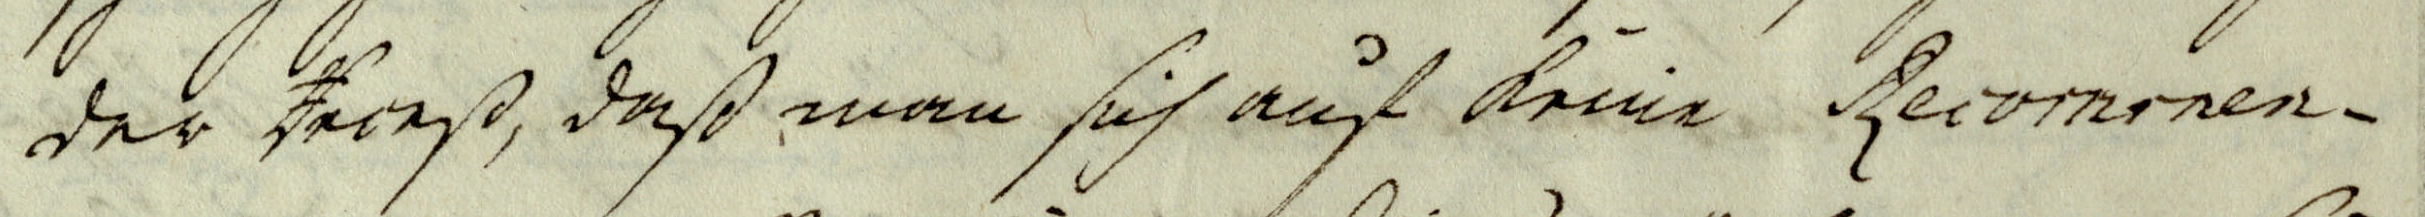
der Receß, daß man sich auf keine Recommen¬
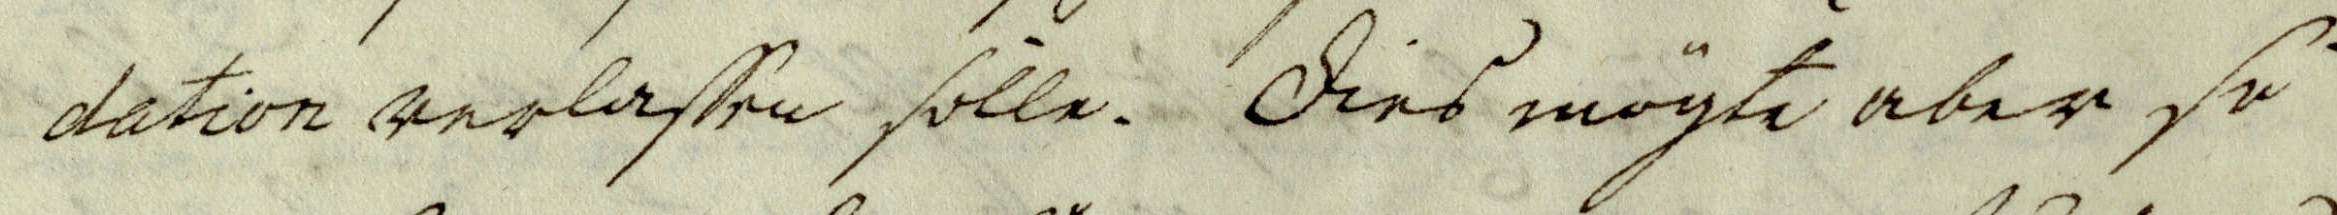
dation verlassen solle. Dies mögte aber so
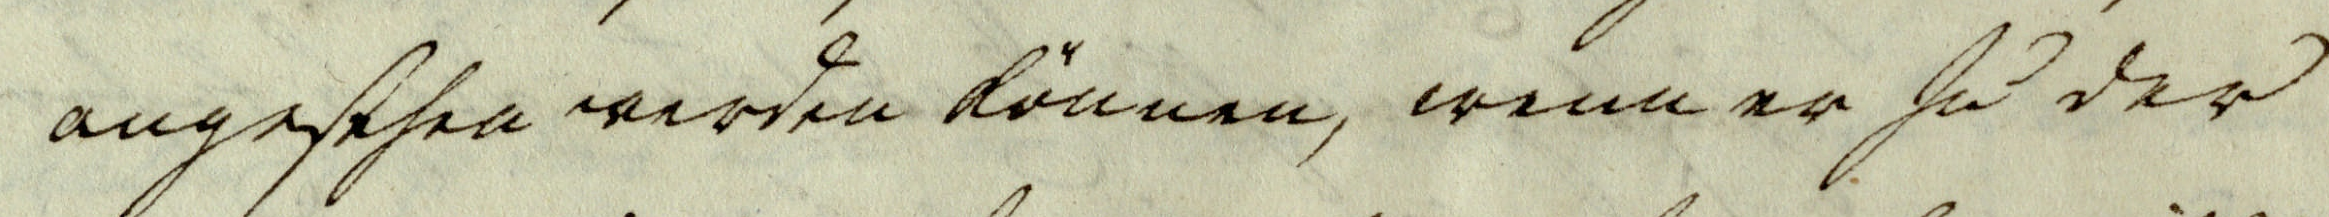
xxx werden können, wenn er zu der
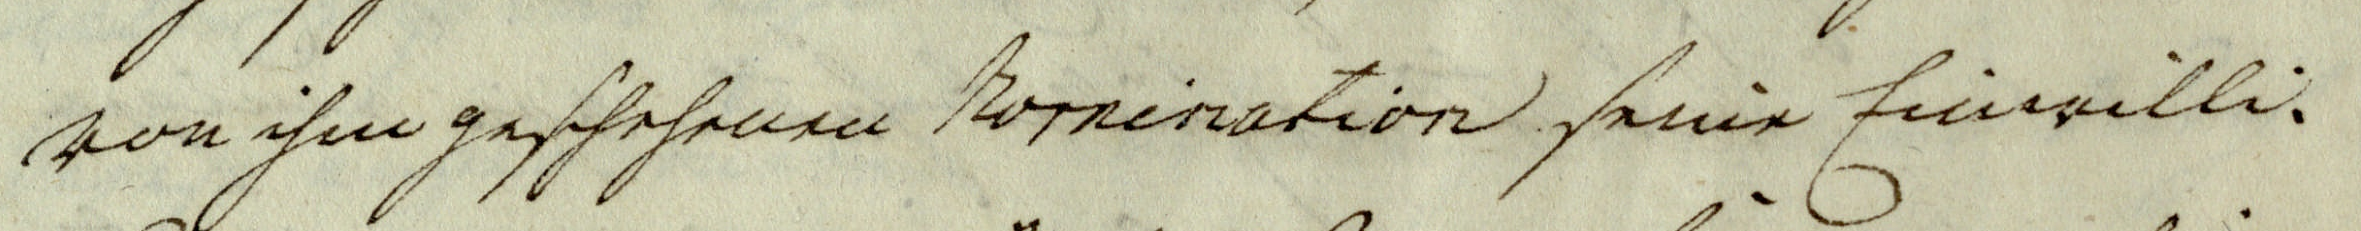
von ihm geschehenen Nomination seine Einwilli¬
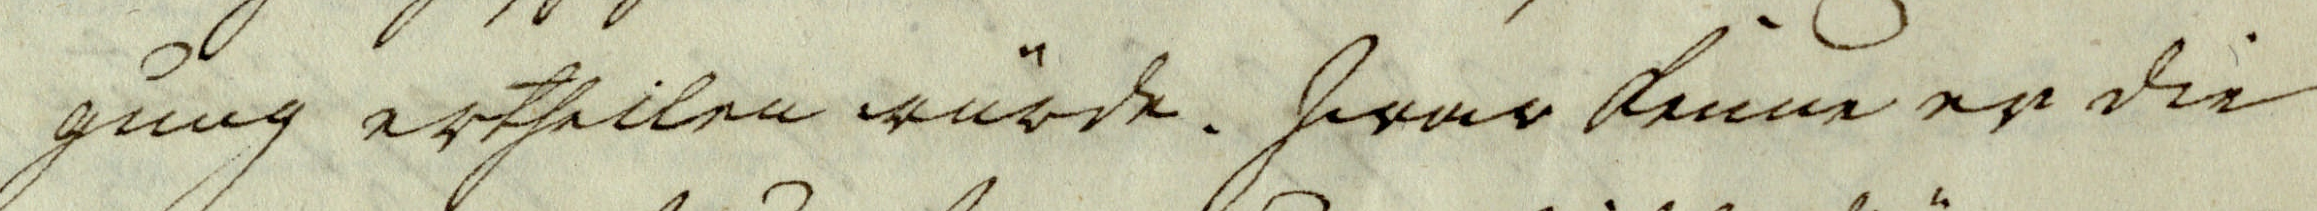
gung ertheilen würde. Zwar kenne er die
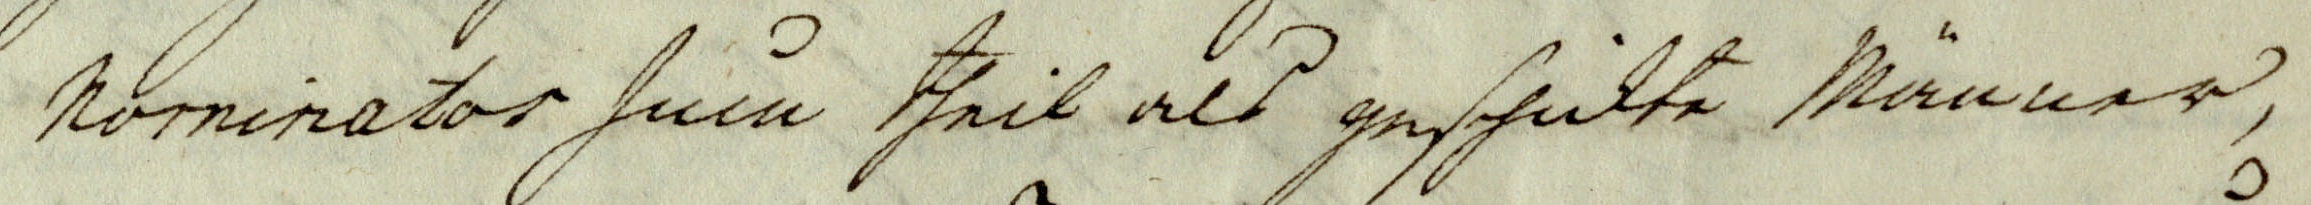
Nominatos zum Theil als geschickte Männer,
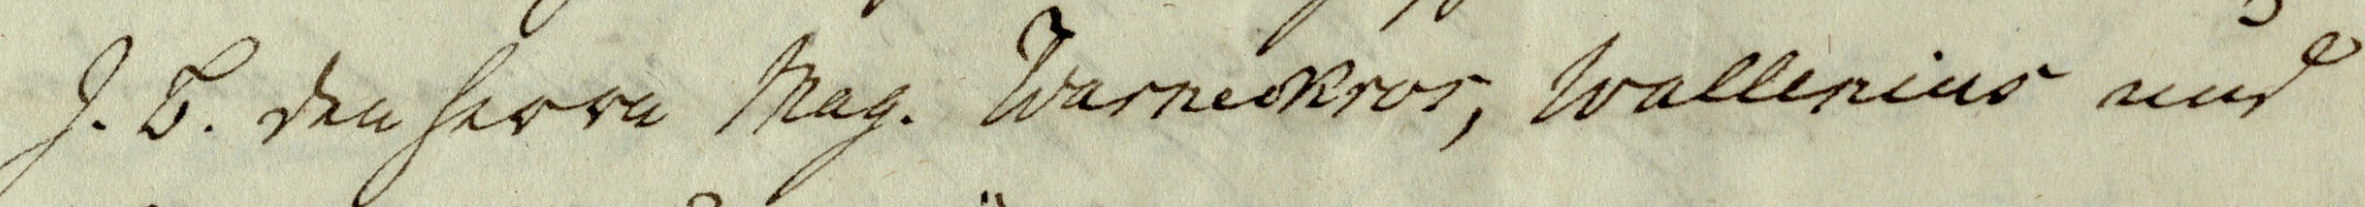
z.B. den Herrn Mag. Warneckros, Wallenius und
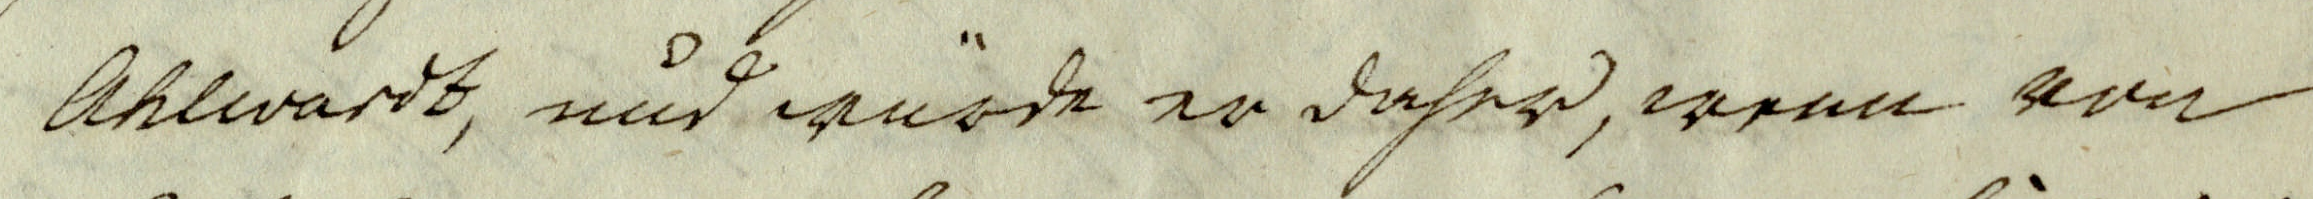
Ahlwardt, und würde er daher, wenn von
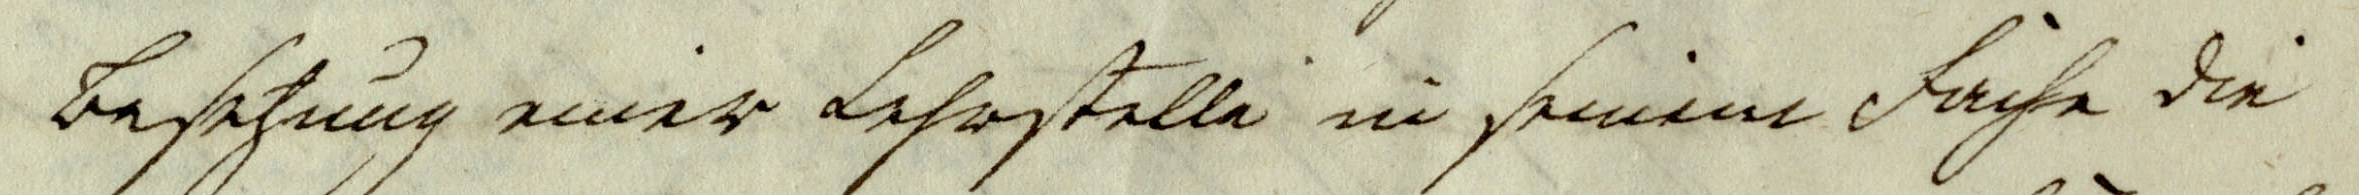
Besetzung einer Lehrstelle in seinem Fache die
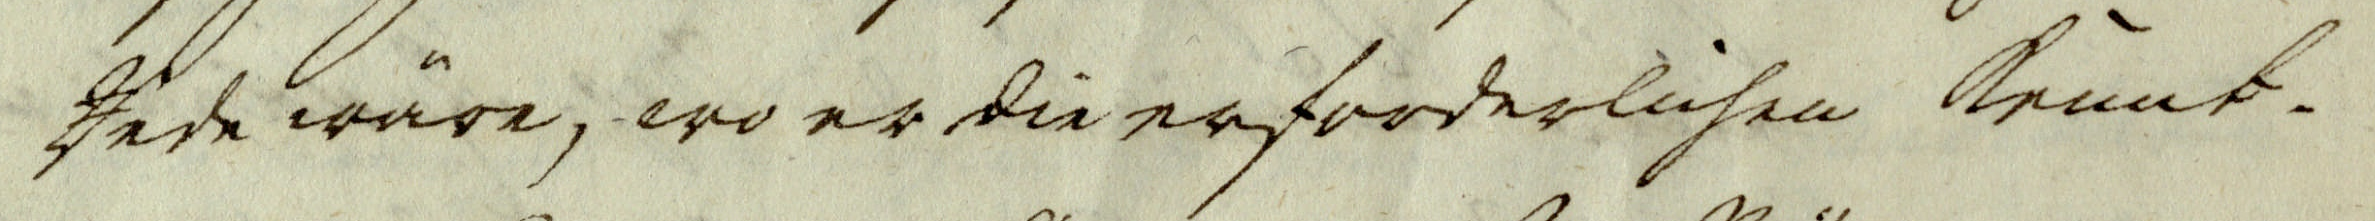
Rede wäre, wo er die erforderlichen Kennt¬
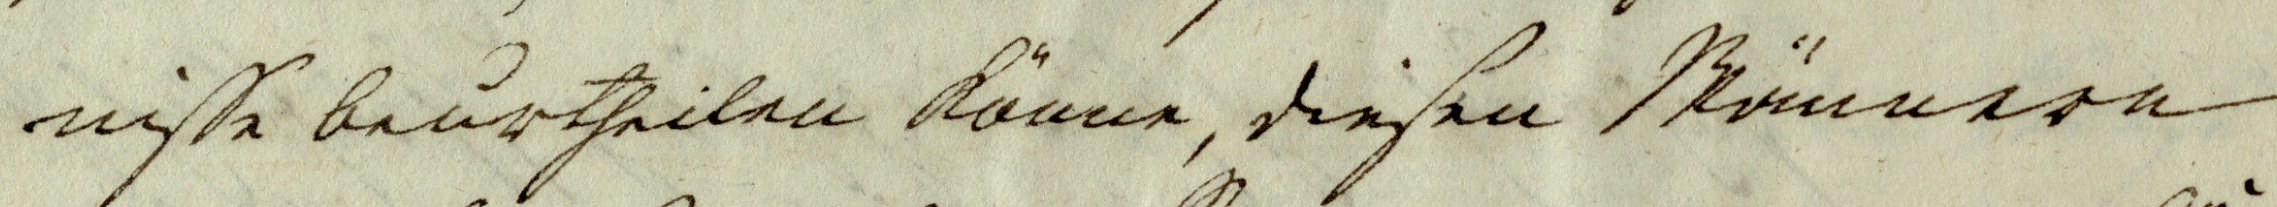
nisse beurtheilen könne, diesen Männern
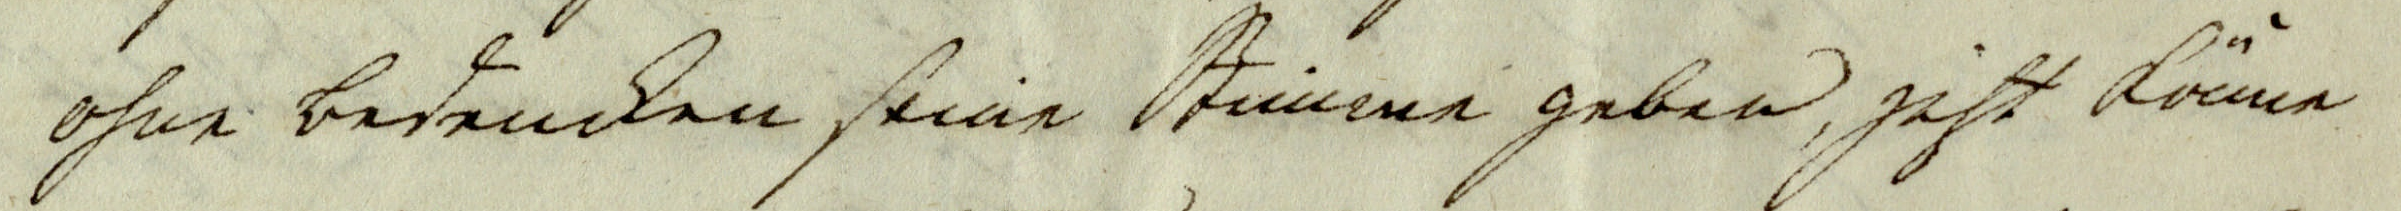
ohne Bedenken seine Stimme geben, jetzt könne
